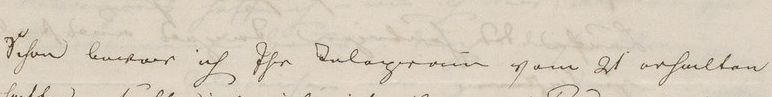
Schon bevor ich Ihr Telegramm vom 21t erhalten
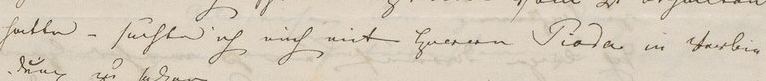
hatte – suchte ich mich mit Herrn Pioda in Verbin-
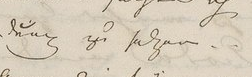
dung zu setzen.
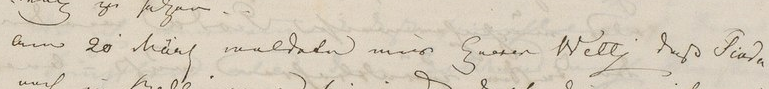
Am 20t März meldete mir Herr Weltj daß Pioda
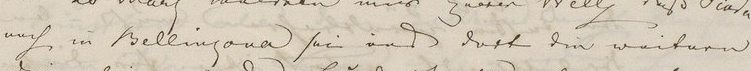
noch in Bellinzona sei und dort die weitern
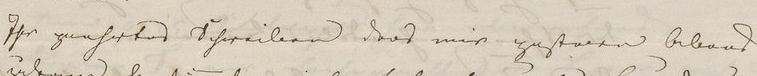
Ihr geehrtes Schreiben das mir gestern Abend
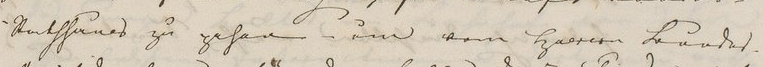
Rathhaus zu gehen – um von Herrn Bundes-
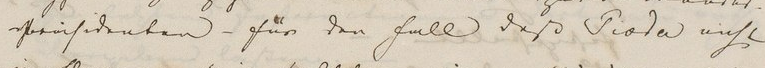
Präsidenten – für den Fall daß Pioda nicht
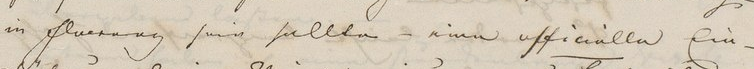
in Florenz sein sollte – eine officielle Ein-
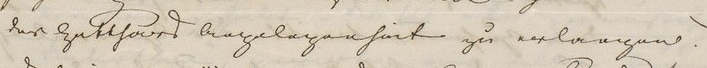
der Gotthard Angelegenheit zu erlangen.
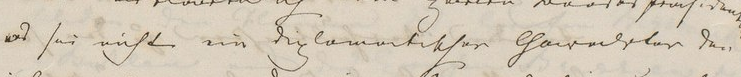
es sei nicht ein diplomatischer Charakter den
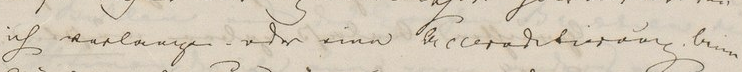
ich verlange – oder eine Accreditirung beim
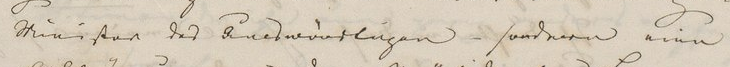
Minister des Auswärtigen – sondern eine
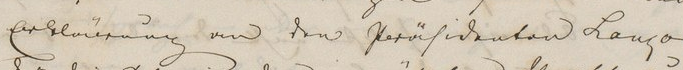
Erklärung an den Präsidenten Lanza
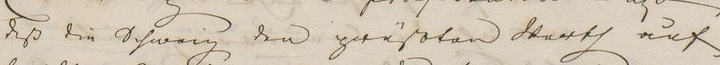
daß die Schweiz den größten Werth auf
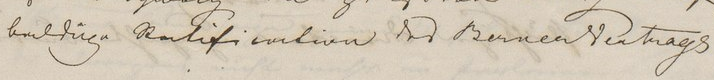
baldige Ratification des BernerVertrags
